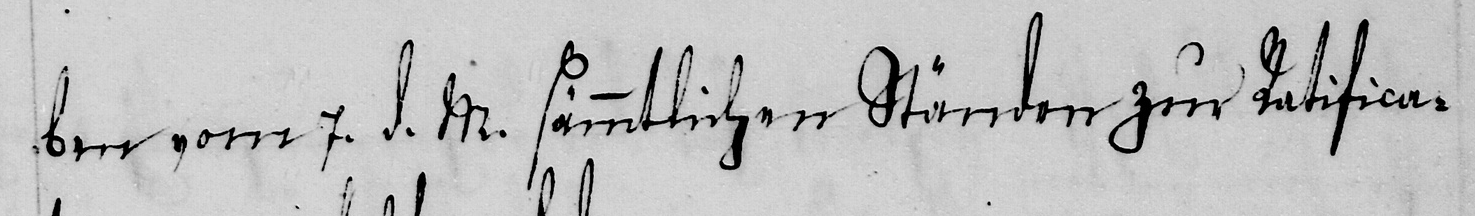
ben vom 7. d. M. sämmtlichen Ständen zur Ratifica¬
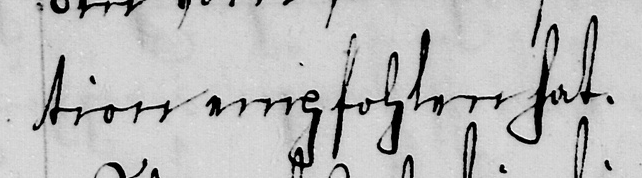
tion empfohlen hat.
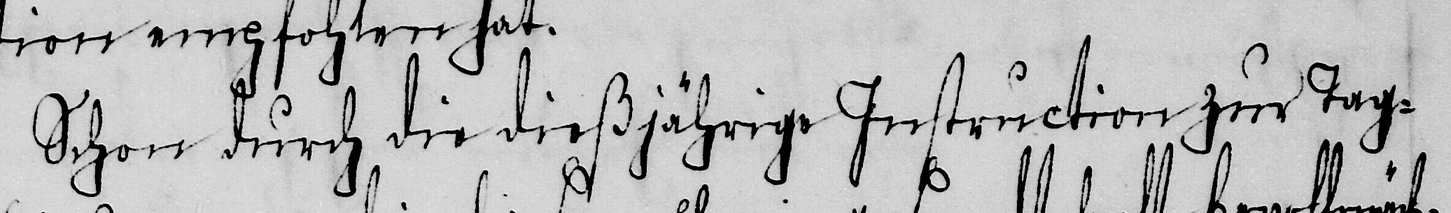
Schon durch die dießjährige Instruction zur Tag¬
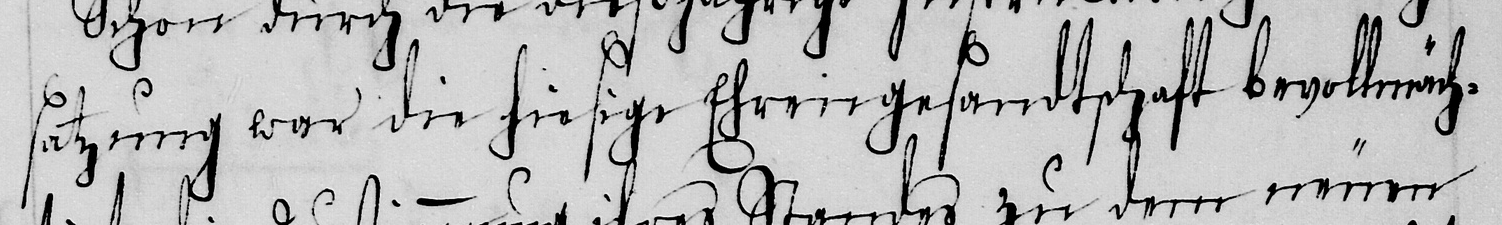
satzung war die hiesige Ehrengesandtschaft bevollmäch¬
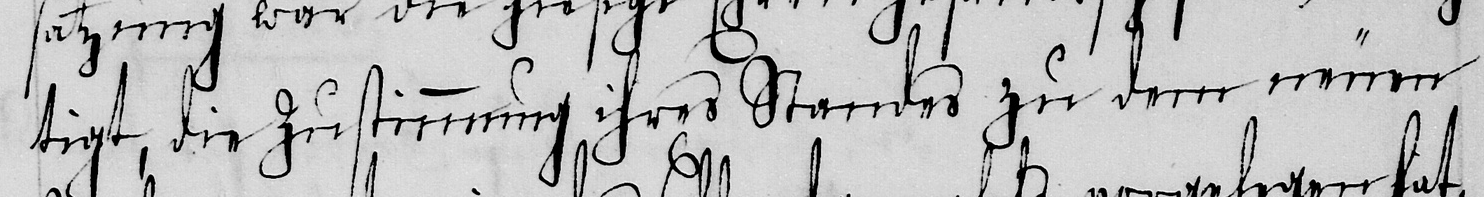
tigt, die Zustimmung ihres Standes zu dem neuen
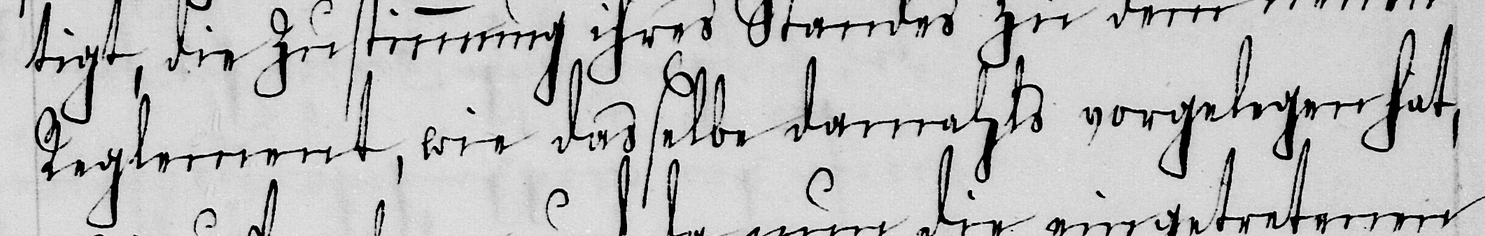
Reglement, wie dasselbe damahls vorgelegen hat,
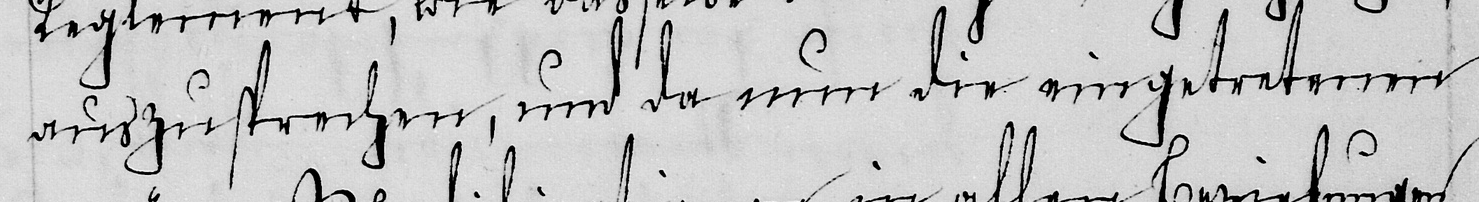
auszusprechen, und da nun die eingetretenen
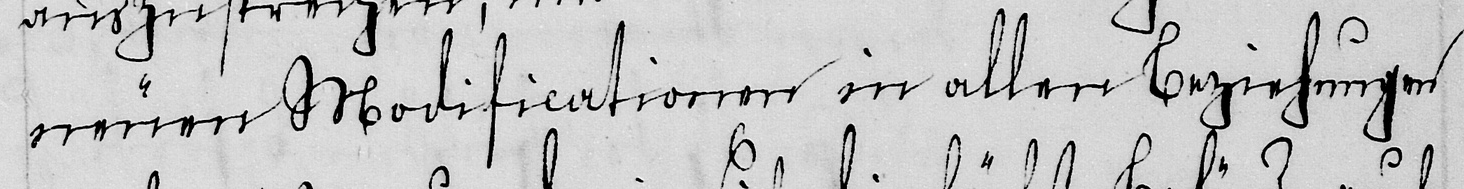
neuen Modificationen in allen Beziehungen
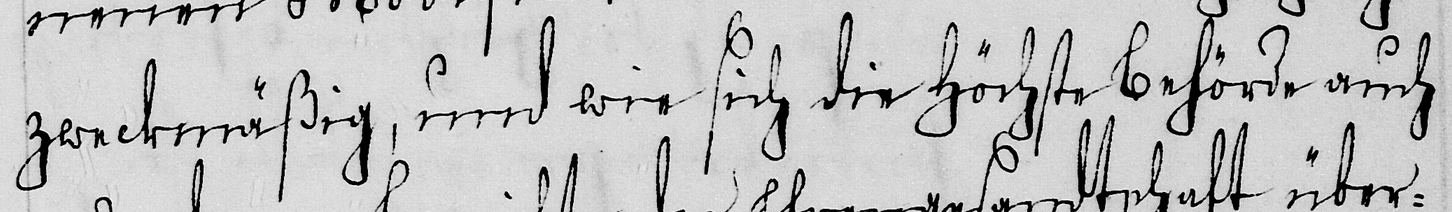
zweckmäßig, und wie sich die höchste Behörde auch
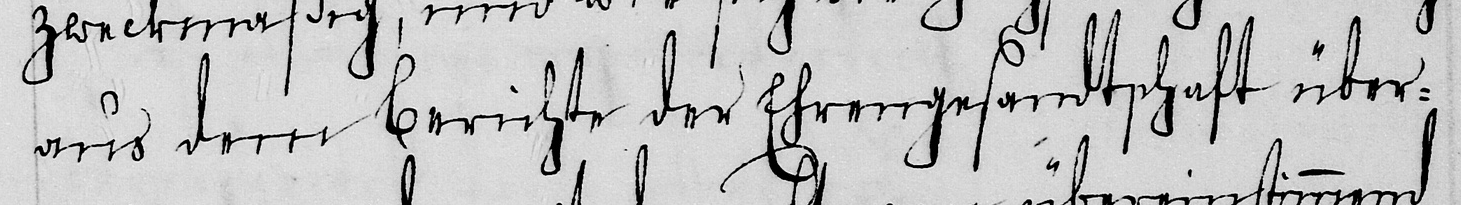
aus dem Berichte der Ehrengesandtschaft über¬
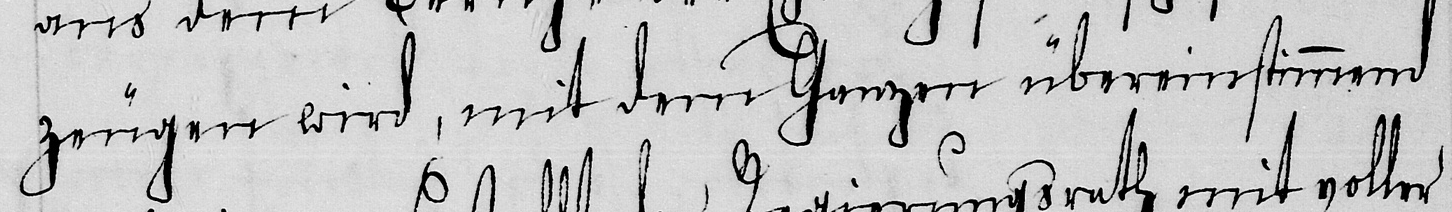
zeugen wird, mit dem Ganzen übereinstimmend
